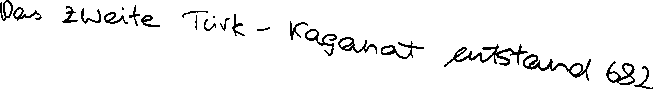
Das Zweite Türk-Kaganat entstand 682
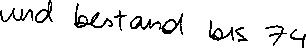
und bestand bis 74
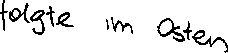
folgte im Osten
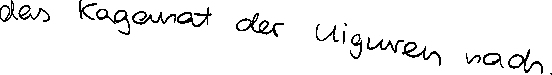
das Kaganat der Uiguren nach.
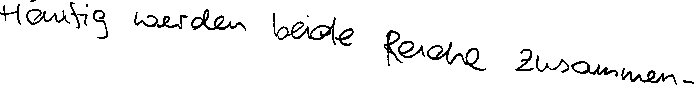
Häufig werden beide Reiche zusammen-
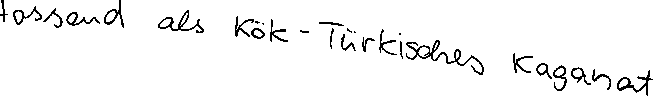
fassend als Kök-Türkisches Kaganat
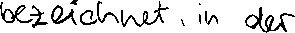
bezeichnet, in der
